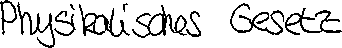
Physikalisches Gesetz
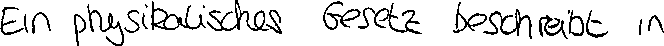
Ein physikalisches Gesetz beschreibt in
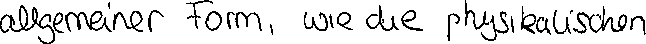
allgemeiner Form, wie die physikalischen
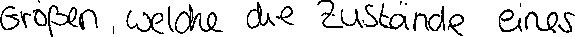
Größen, welche die Zustände eines
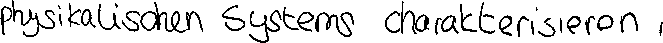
physikalischen Systems charakterisieren,
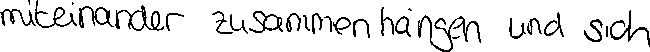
miteinander zusammenhängen und sich
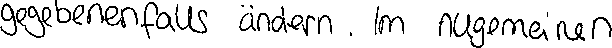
gegebenenfalls ändern. Im Allgemeinen
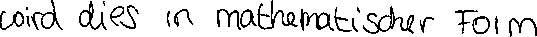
wird dies in mathematischer Form
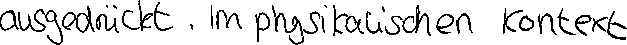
ausgedrückt. Im physikalischen Kontext
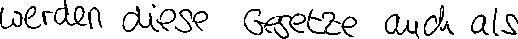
werden diese Gesetze auch als
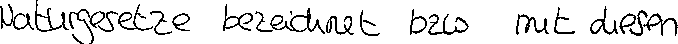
Naturgesetze bezeichnet bzw. mit diesen
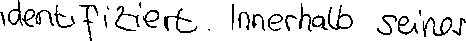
identifiziert. Innerhalb seines
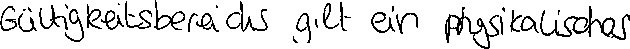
Gültigkeitsbereichs gilt ein physikalisches
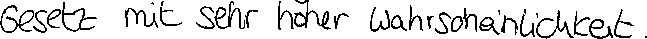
Gesetz mit sehr hoher Wahrscheinlichkeit.
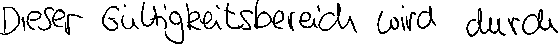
Dieser Gültigkeitsbereich wird durch
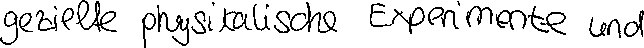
gezielte physikalische Experimente und
